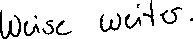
Weise weiter.
